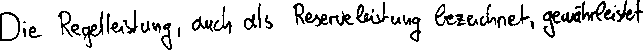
Die Regelleistung, auch als Reserveleistung bezeichnet, gewährleistet
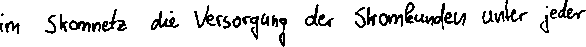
im Stromnetz die Versorgung der Stromkunden unter jeder
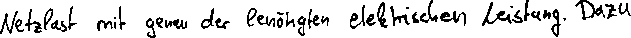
Netzlast mit genau der benötigten elektrischen Leistung. Dazu
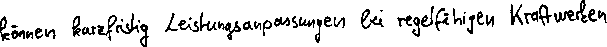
können kurzfristig Leistungsanpassungen bei regelfähigen Kraftwerken
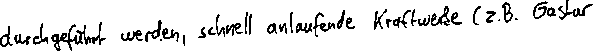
durchgeführt werden, schnell anlaufende Kraftwerke (z. B. Gastur
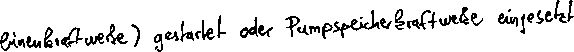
binenkraftwerke) gestartet oder Pumpspeicherkraftwerke eingesetzt
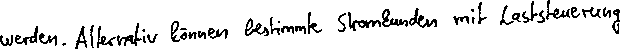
werden. Alternativ können bestimmte Stromkunden mit Laststeuerung
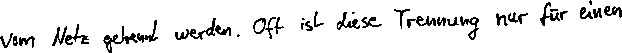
vom Netz getrennt werden. Oft ist diese Trennung nur für einen
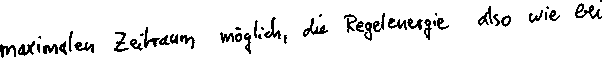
maximalen Zeitraum möglich, die Regelenergie also wie bei
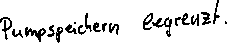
Pumpspeichern begrenzt.
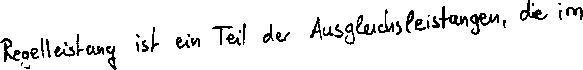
Regelleistung ist ein Teil der Ausgleichsleistungen, die im
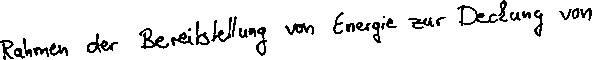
Rahmen der Bereitstellung von Energie zur Deckung von
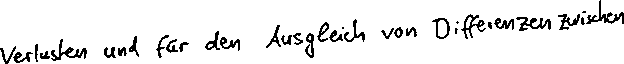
Verlusten und für den Ausgleich von Differenzen zwischen
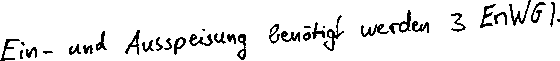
Ein- und Ausspeisung benötigt werden 3 EnWG).
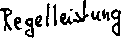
Regelleistung
